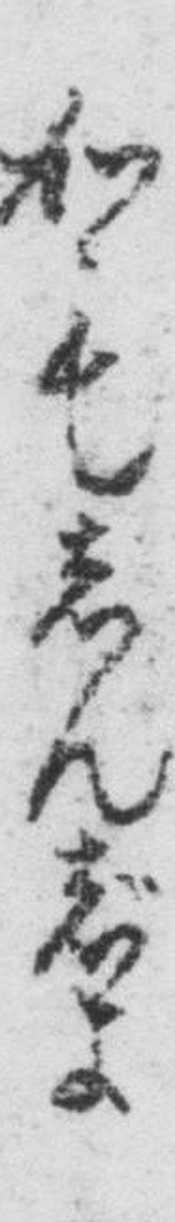きすしんじよ
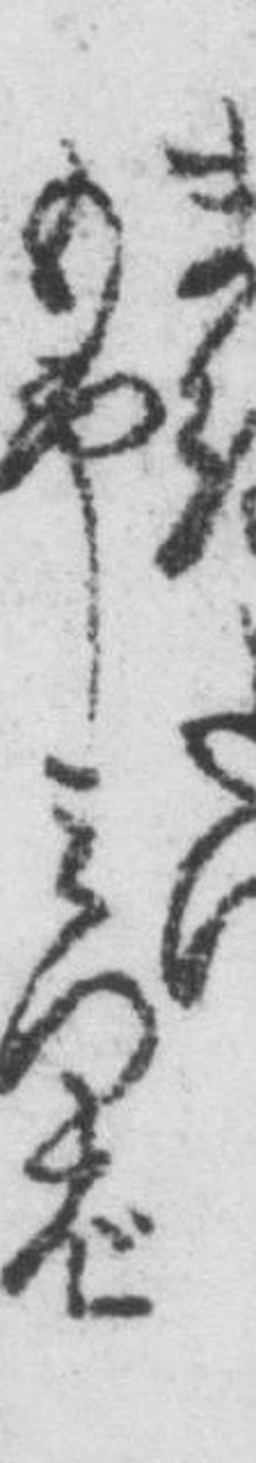もやしミつば
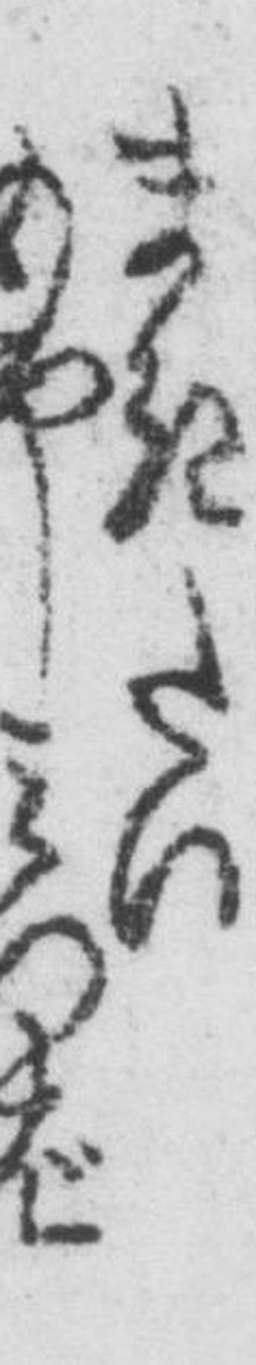もやしミつば
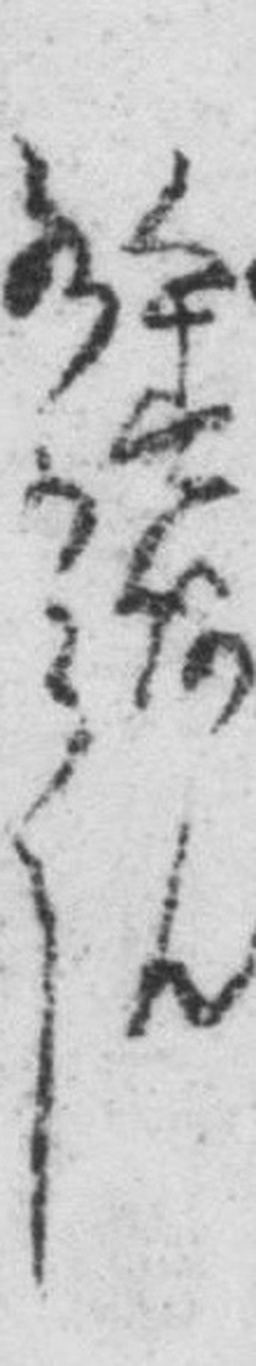水からし
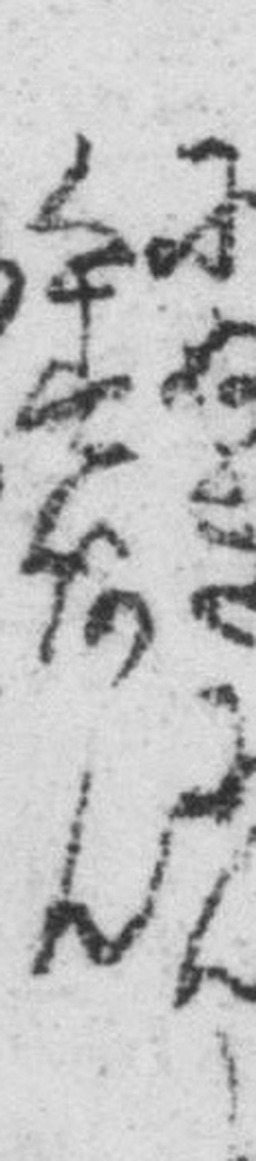くすあん
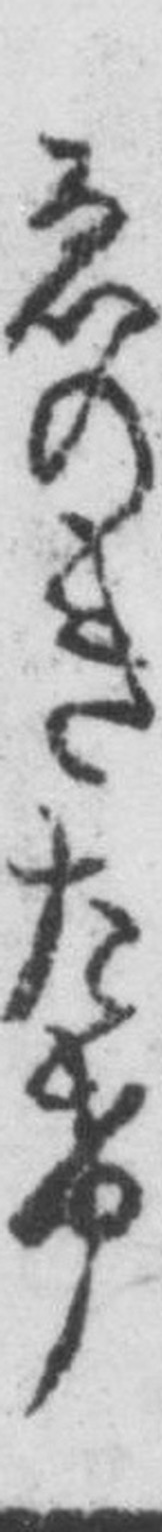ゑのきたけ
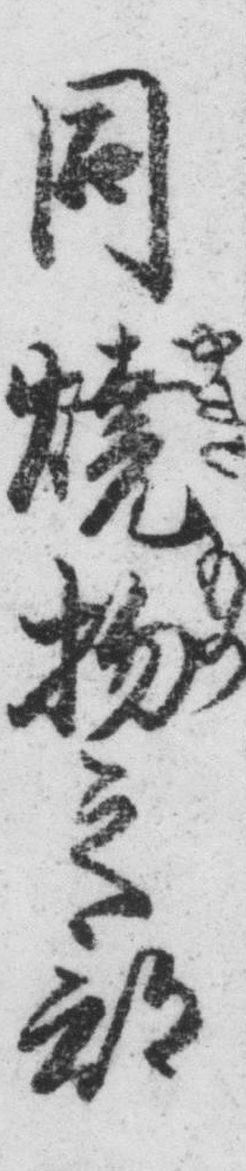同焼物之部
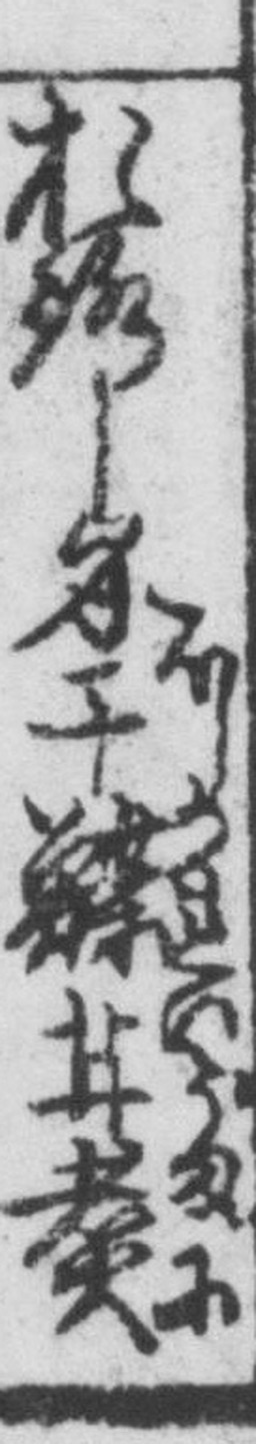おろし身干し鰈甘煮
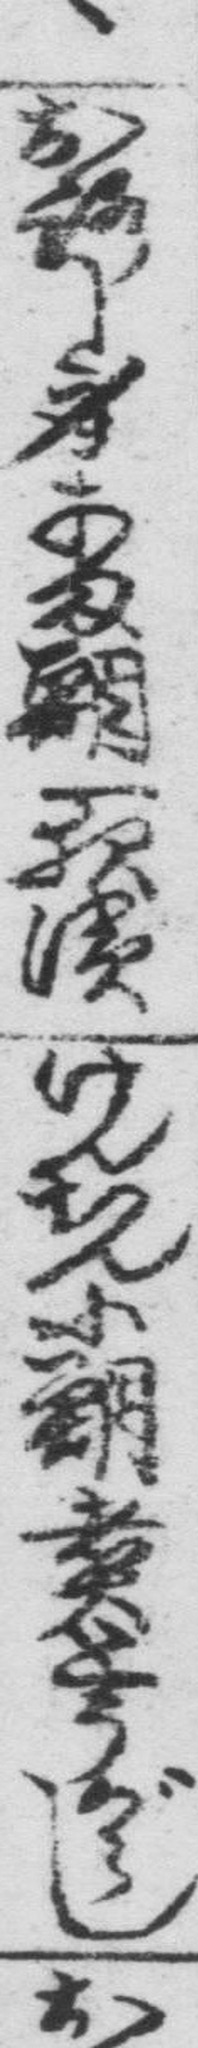おろし身あま鯛一夜漬けんちん小鯛煮とうがらし
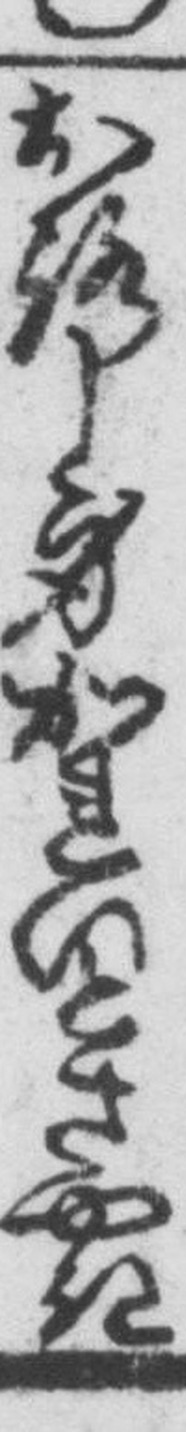おろし身かれいとさやき
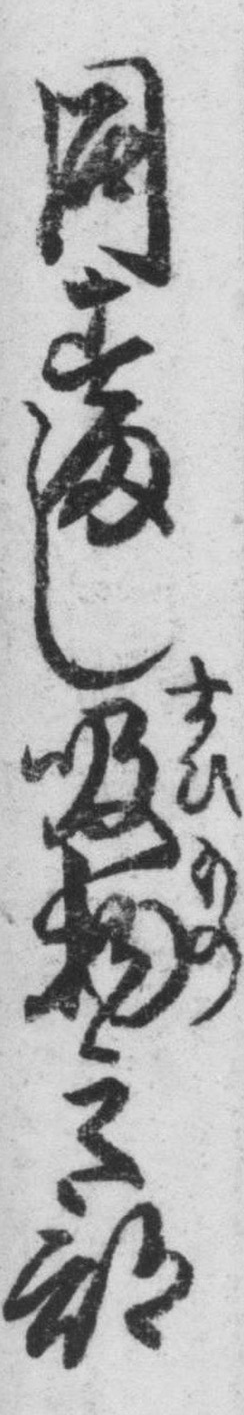同すまし吸物之部
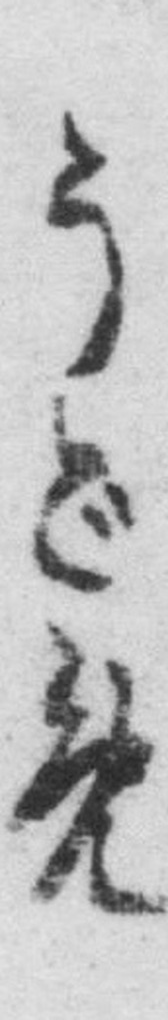うとめ
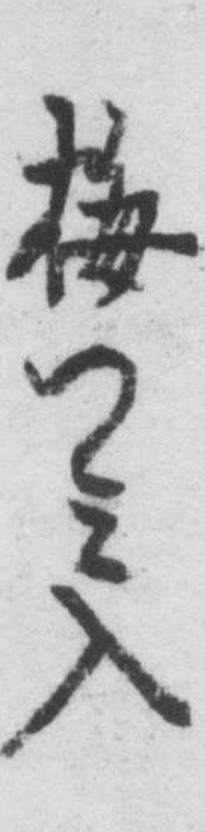梅つミ入
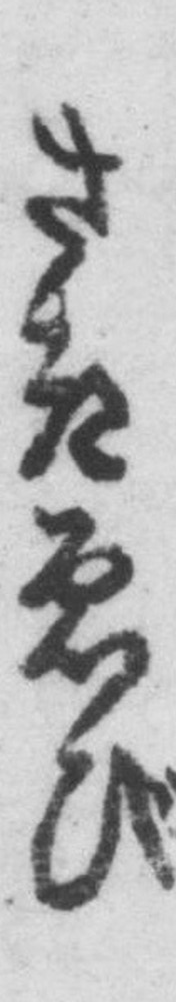さきゑび
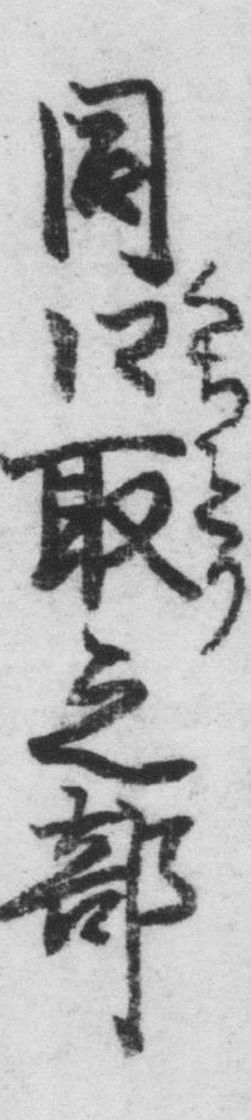同口取之部
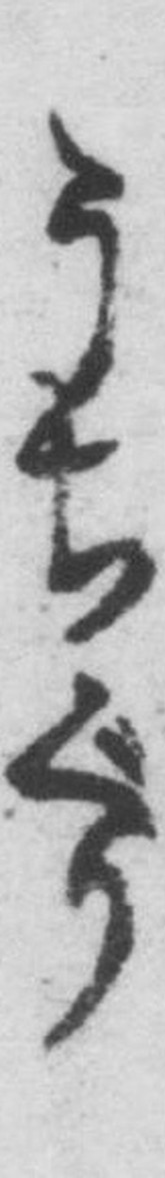うちぐり
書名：即席庖丁
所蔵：大阪府立大学学術情報センター 国文学研究資料館
